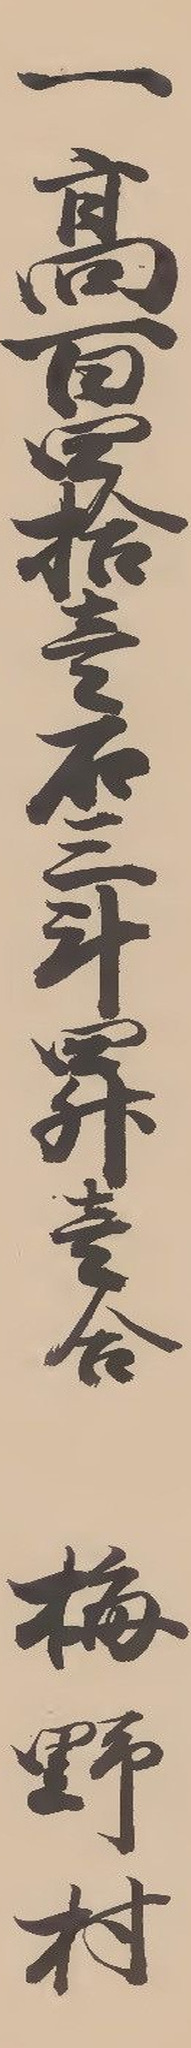一高百四拾壱石三斗四升壱合梅野村
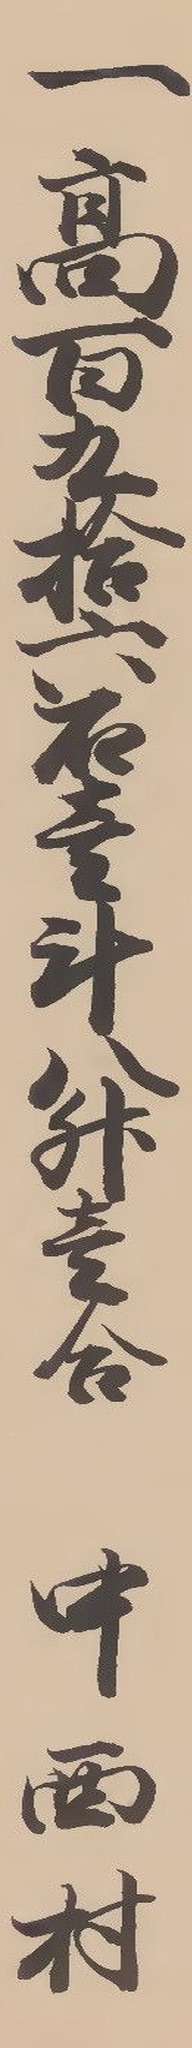一高百九拾六石壱斗八升壱合中西村
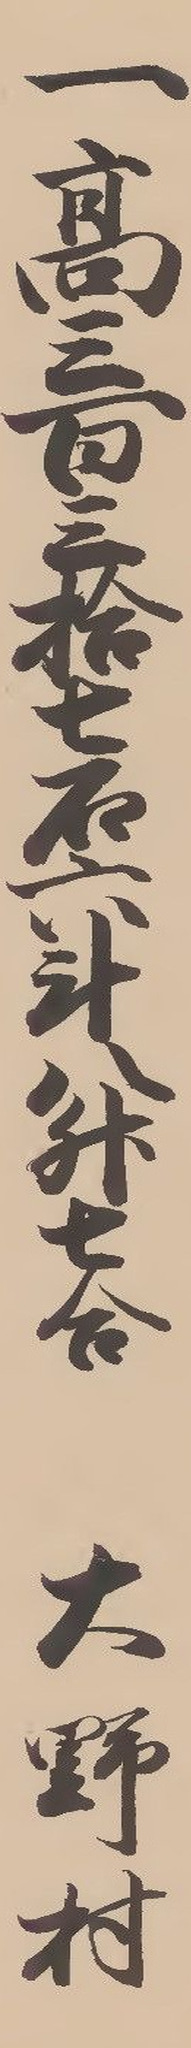一高三百三拾七石六斗八升七合大野村
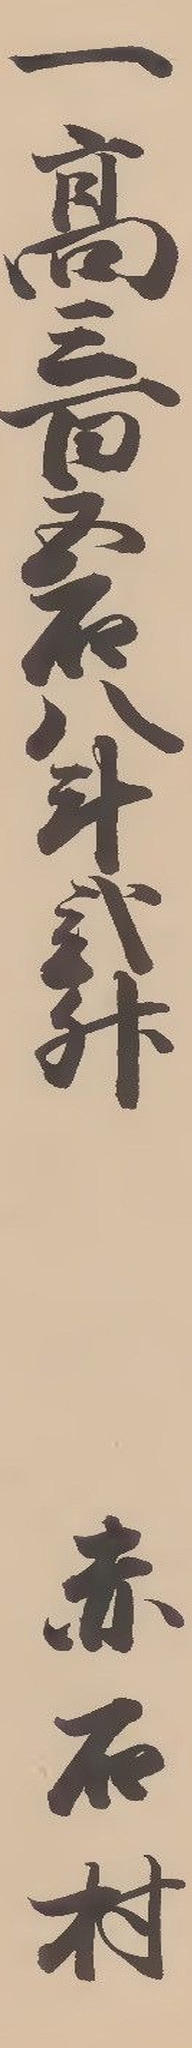一高三百五石八斗弐升赤石村
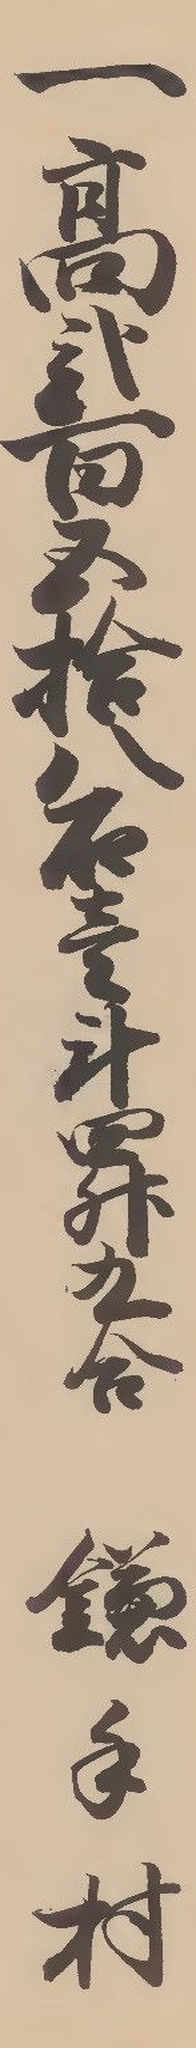一高弐百五拾八石壱斗四升九合鎌手村
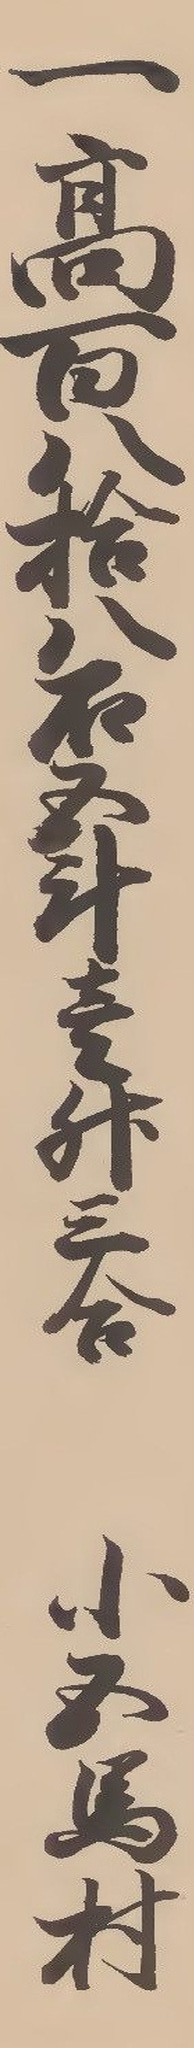一高百八拾八石五斗壱升三合小五馬村
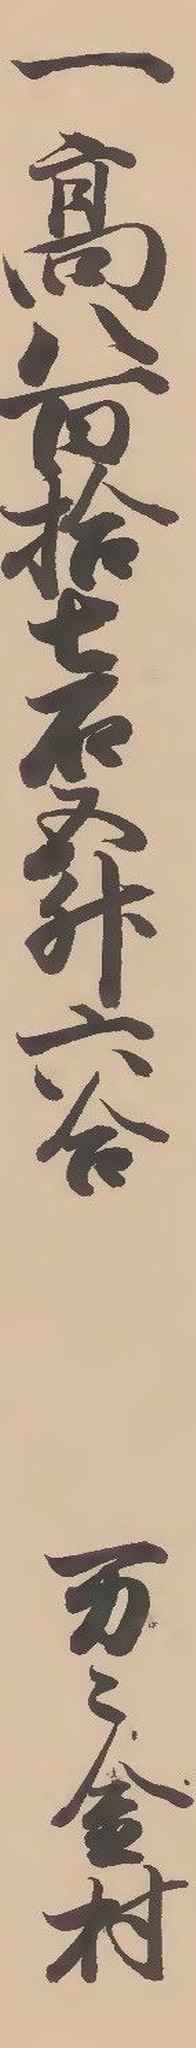一高八百拾七石五升六合万々金村

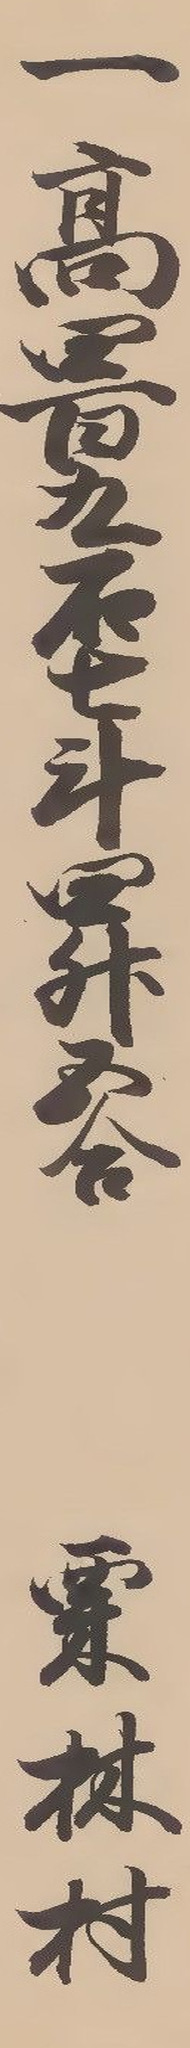一高四百九石七斗四升五合栗林村
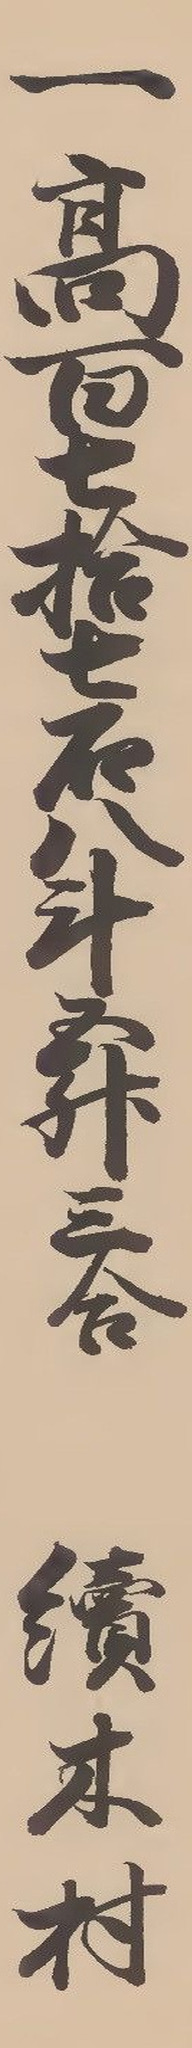一高百七拾七石八斗五升三合続木村
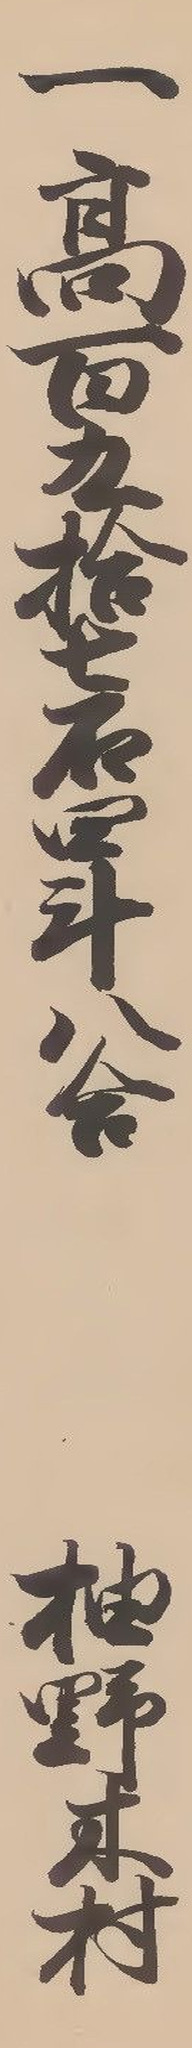一高百九拾七石四斗八合柚野木村
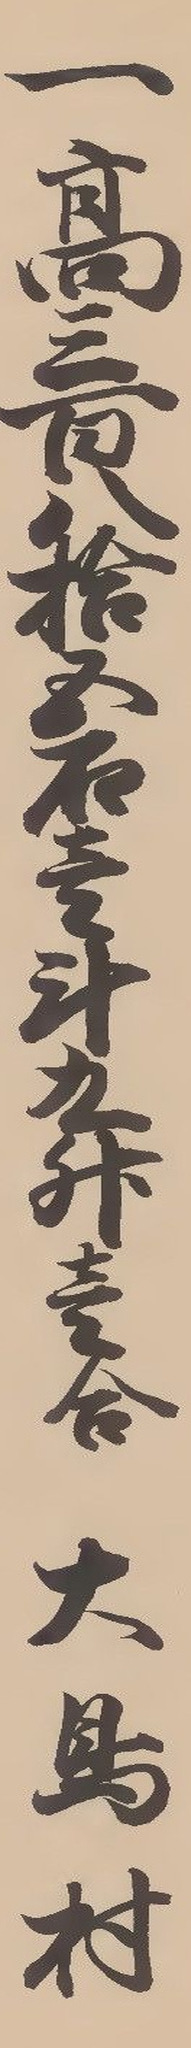一高三百八拾五石壱斗九升壱合大鳥村
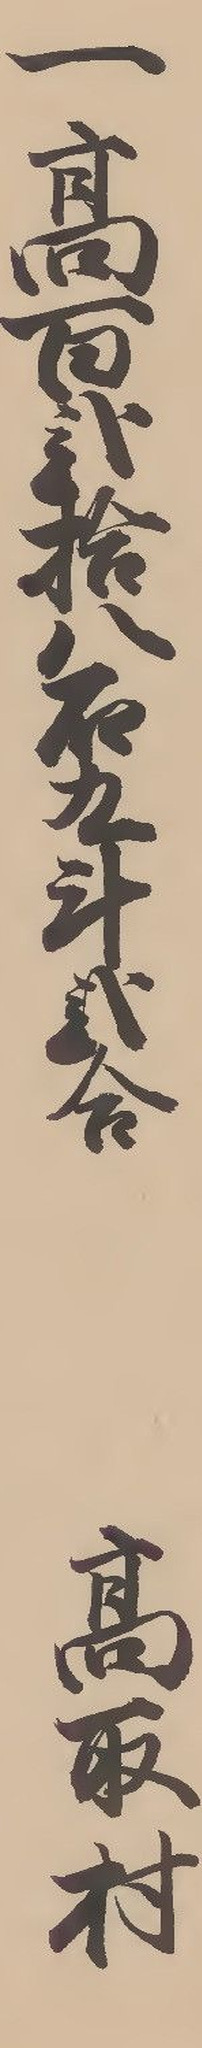一高百弐拾八石九斗弐合高取村
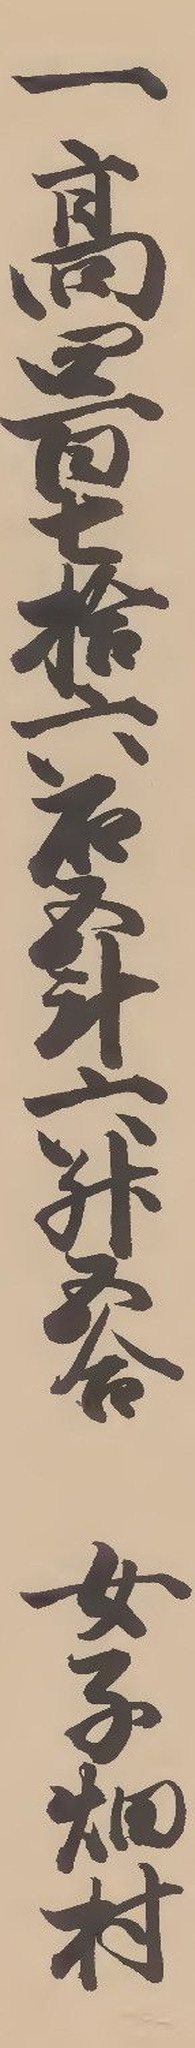一高四百七拾六石五斗六升五合女子畑村
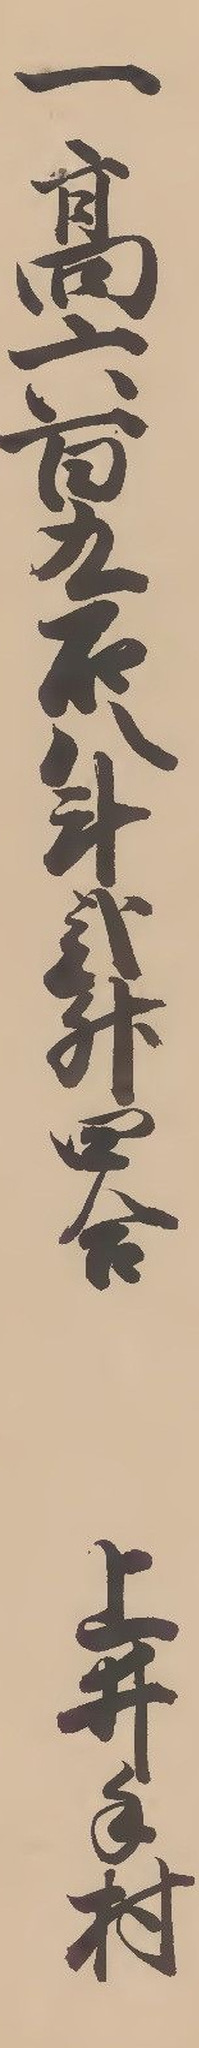一高六百九石八斗弐升四合上井手村

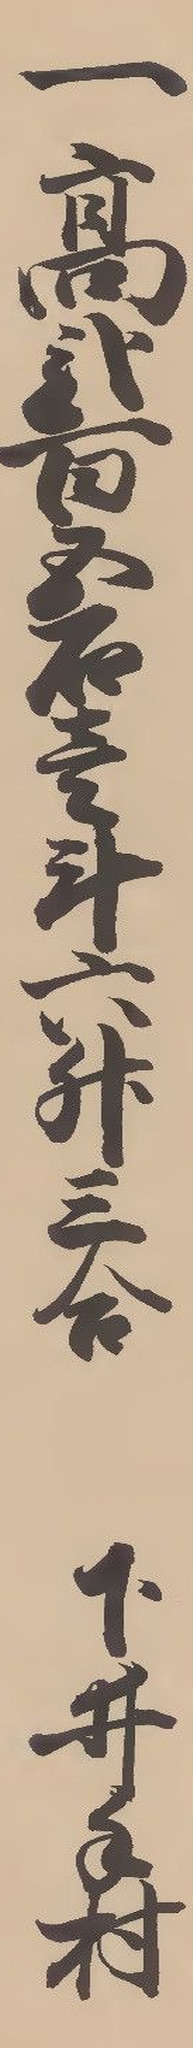一高弐百五石壱斗六升三合下井手村
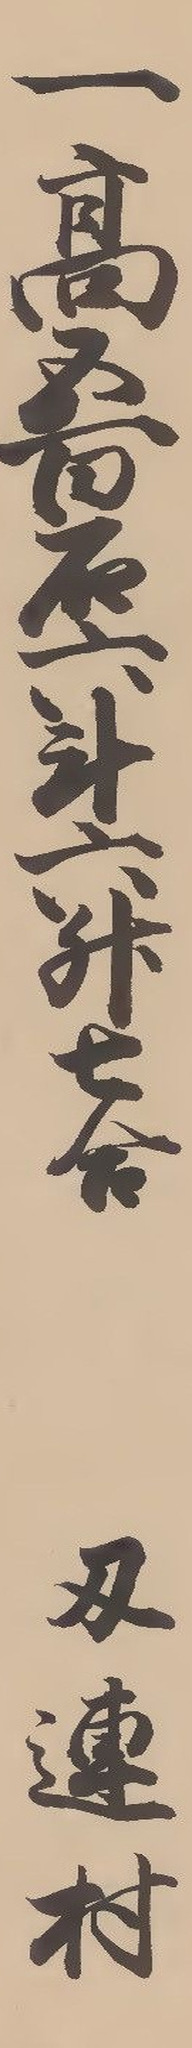一高五百石六斗六升七合刃連村
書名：豊後国郷帳
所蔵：国立公文書館 National Archives of Japan
